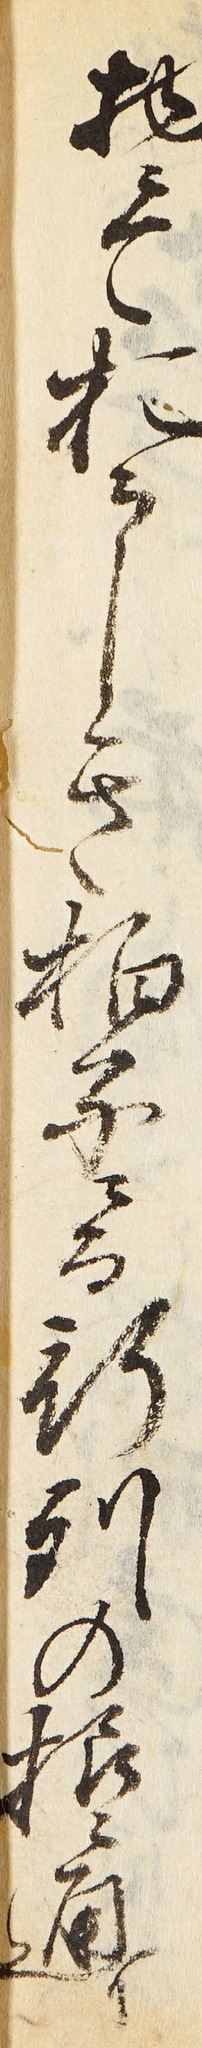物ニておかしき拍子ニ而行列の様ニ通り
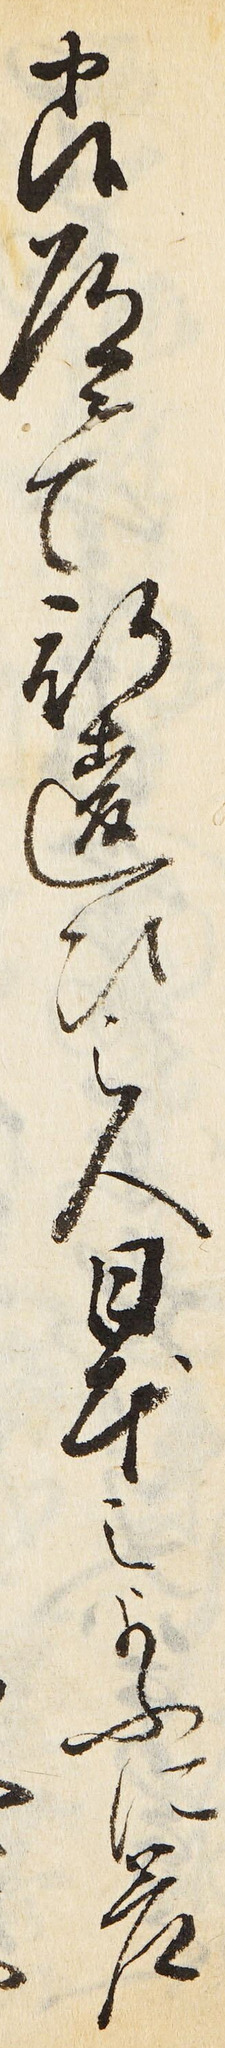申候道ニて行違ひ之人日本之よふに差
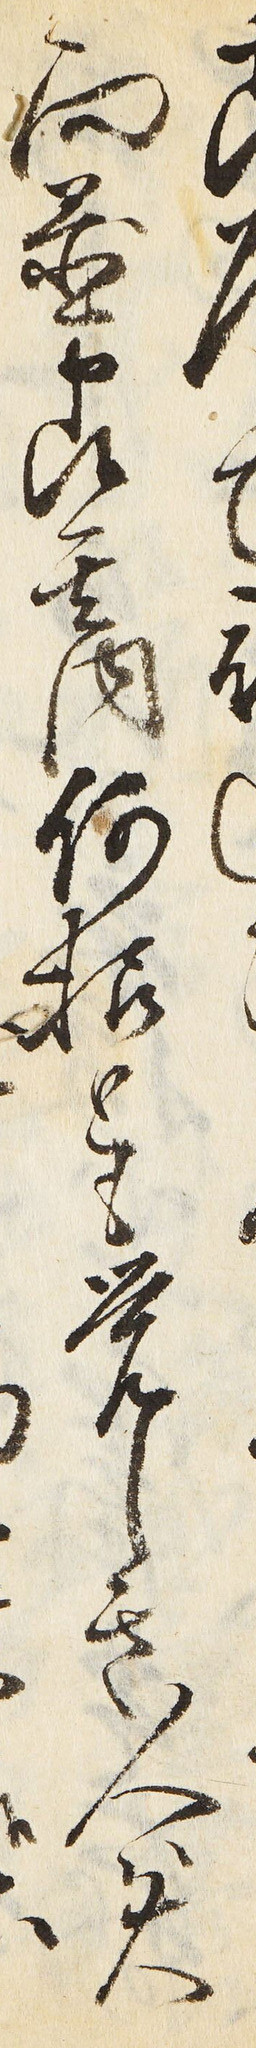向置申候其内何様とも覚しき人ハ大
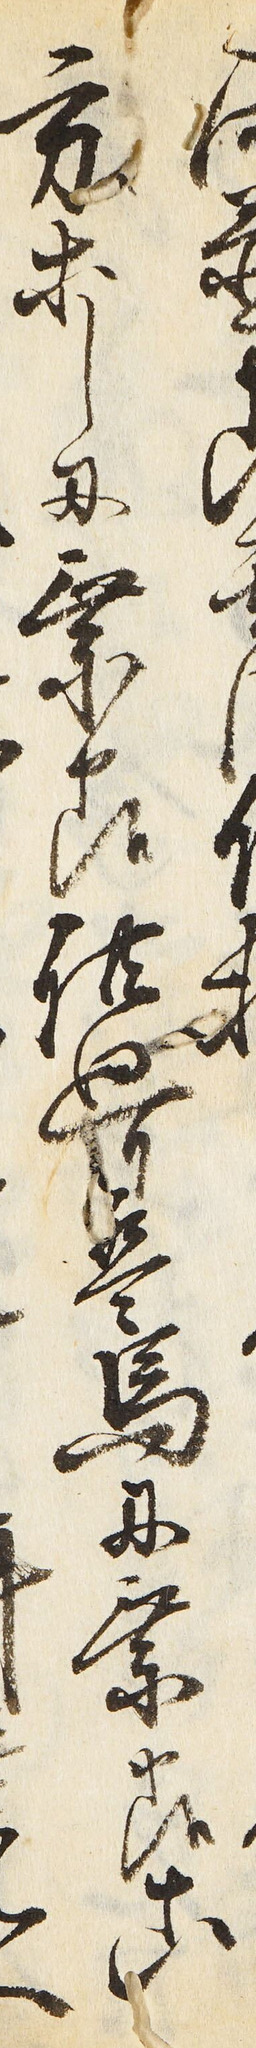方こしに乗申候供廻りは馬に乗申候こ
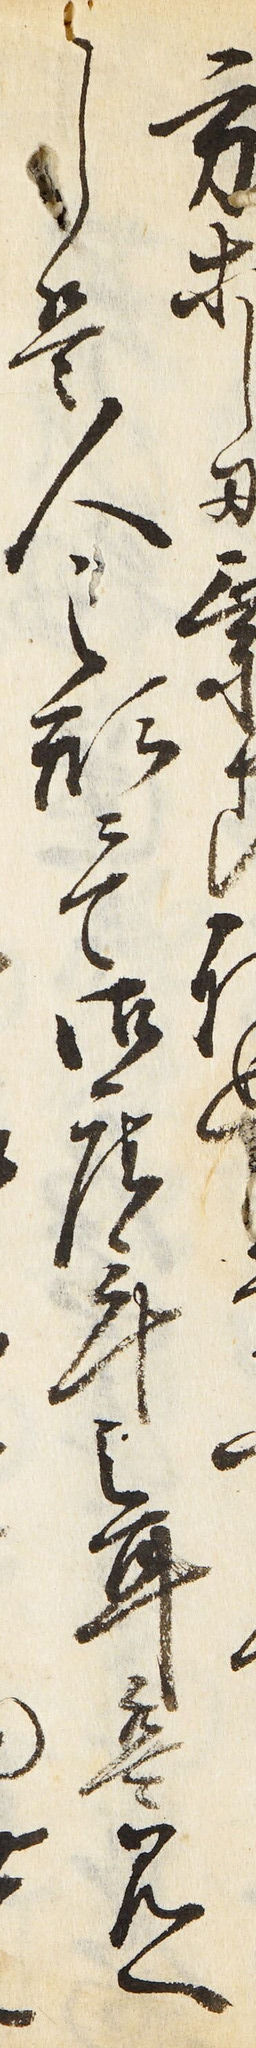しは人之形ニて御座候斗之耳は見へ
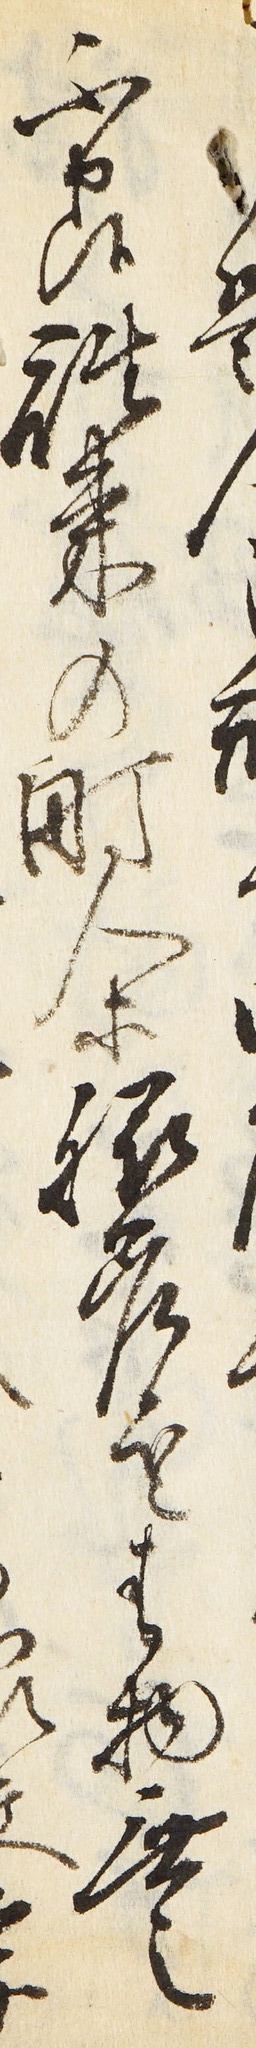不申候往来の町人等脇差もは物無之
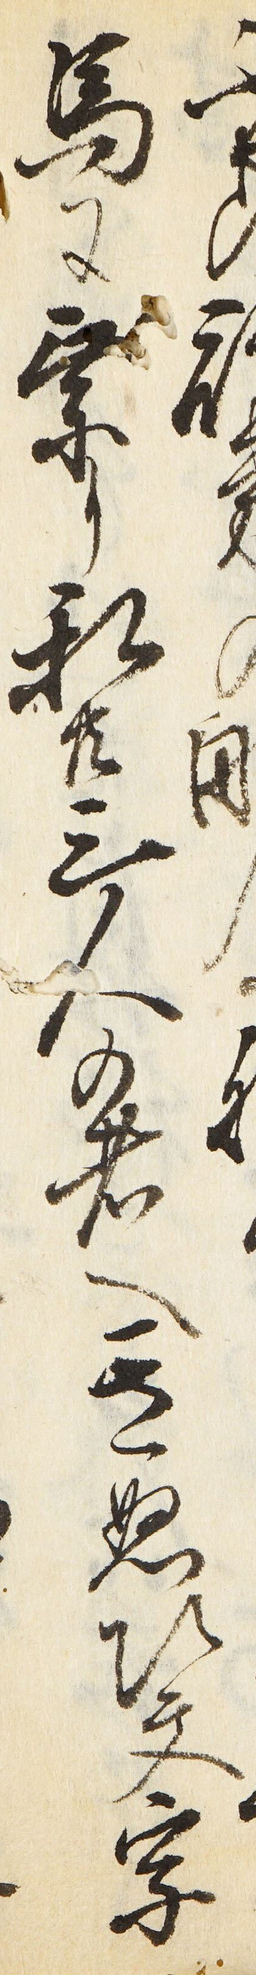馬に乗り私共三人の者へきぬ頭文字
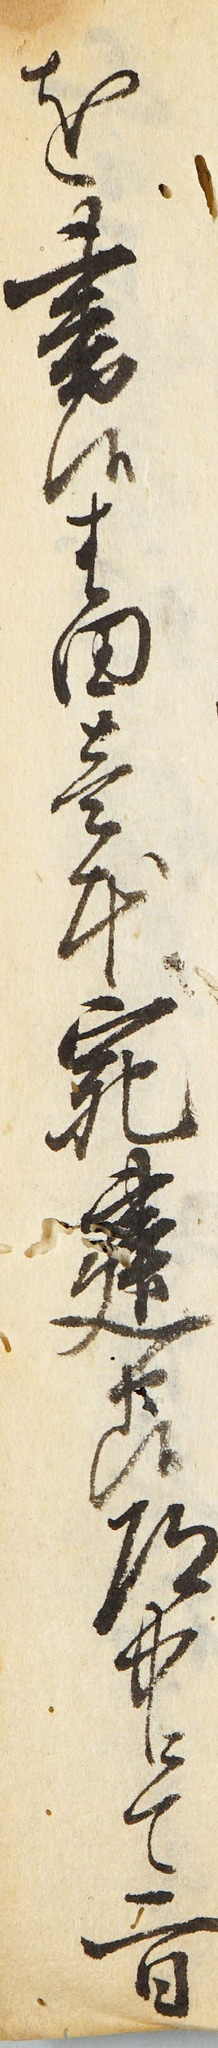を書候はた壱本宛建申候道中にて二日

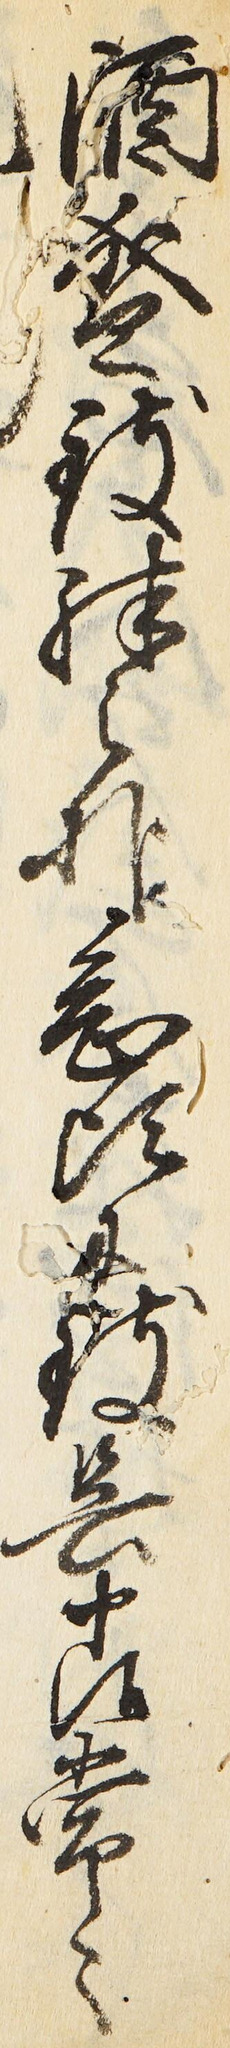酒盛致殊之外念頃に致呉申候常々
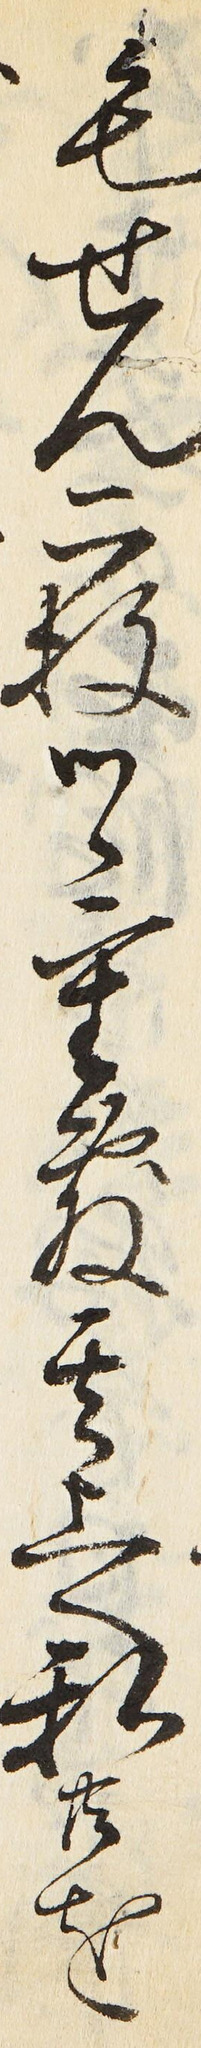毛せん二枚ツヽ重敷其上へ私共を
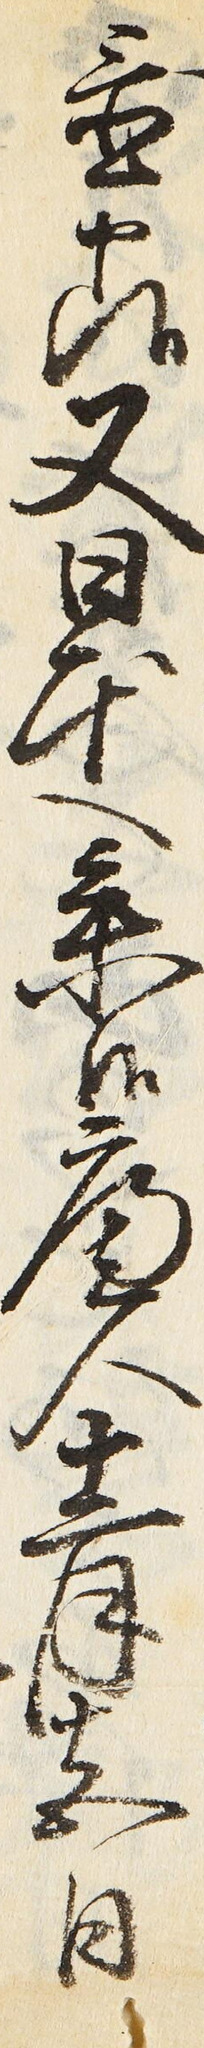置申候又日本へ参候唐人十二月十五日
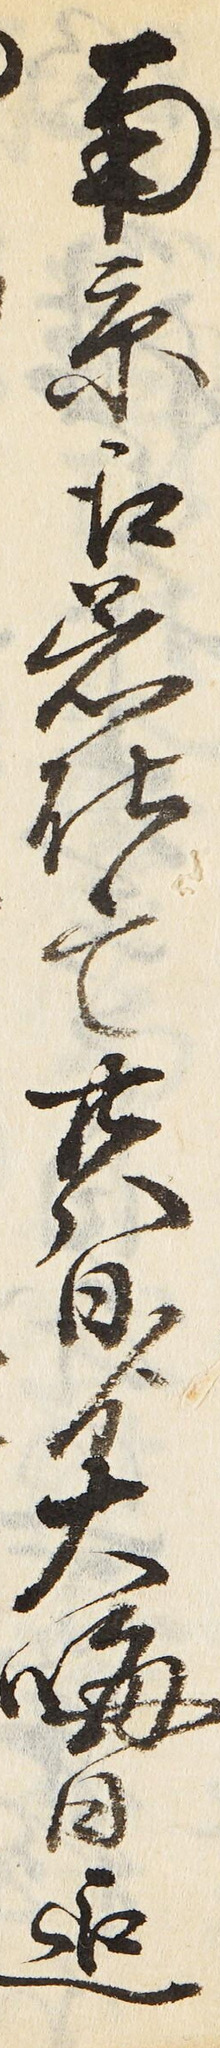南京江着仕候て廿八日ゟ大晦日迄
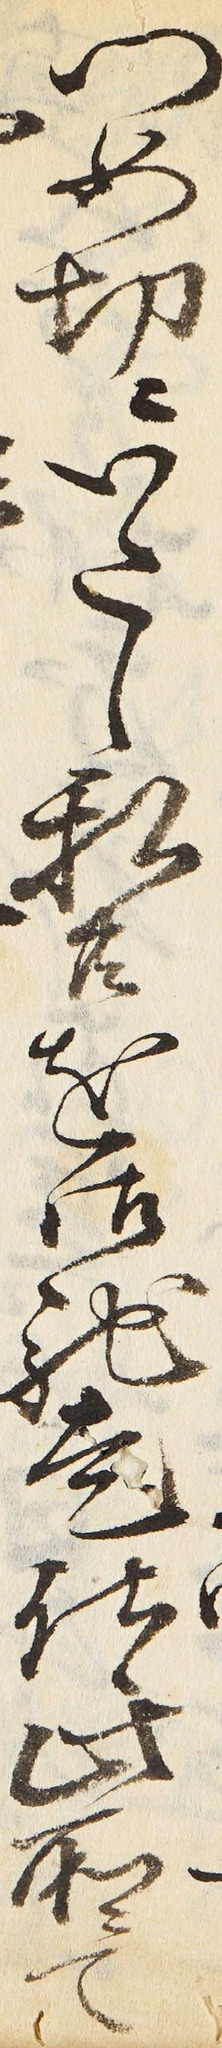つめ切ニいたし私共を御馳走仕候此所ニて
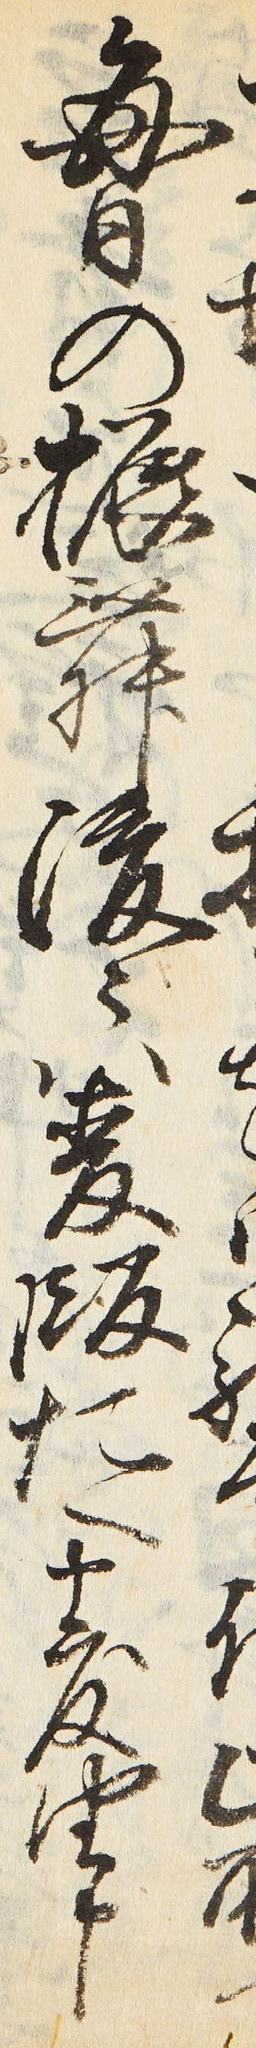毎日の振舞後々ハ麦飯たへ申度由申
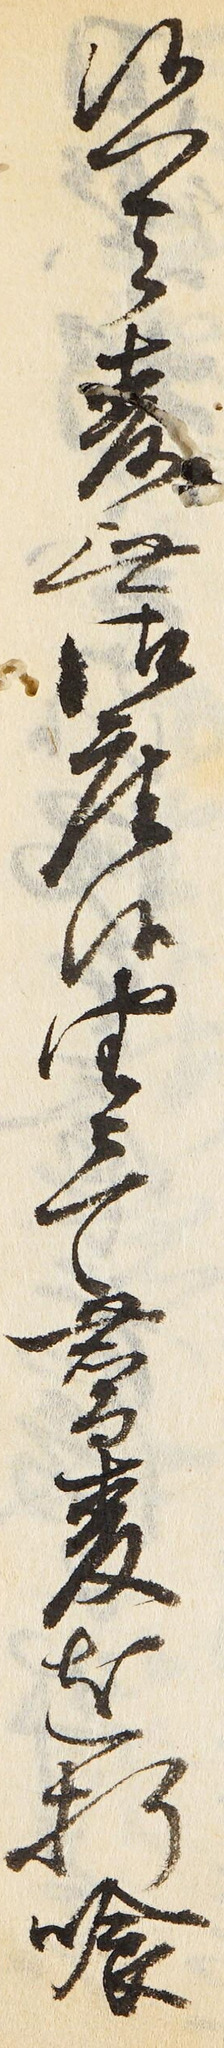候へは麦無御座候由ニて蕎麦を打喰
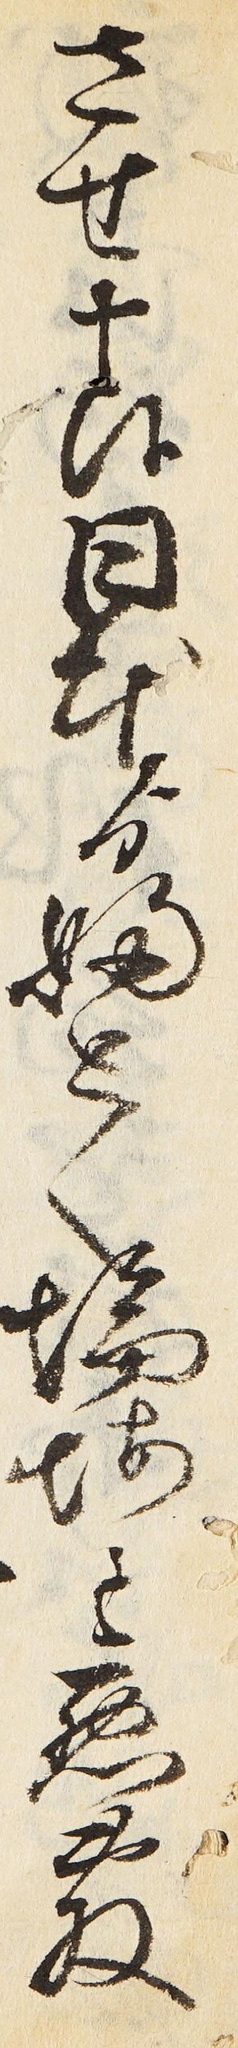させ申候日本ゟふとく塩梅も悪敷
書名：志州鳥羽船頭外国江吹流し候一件
